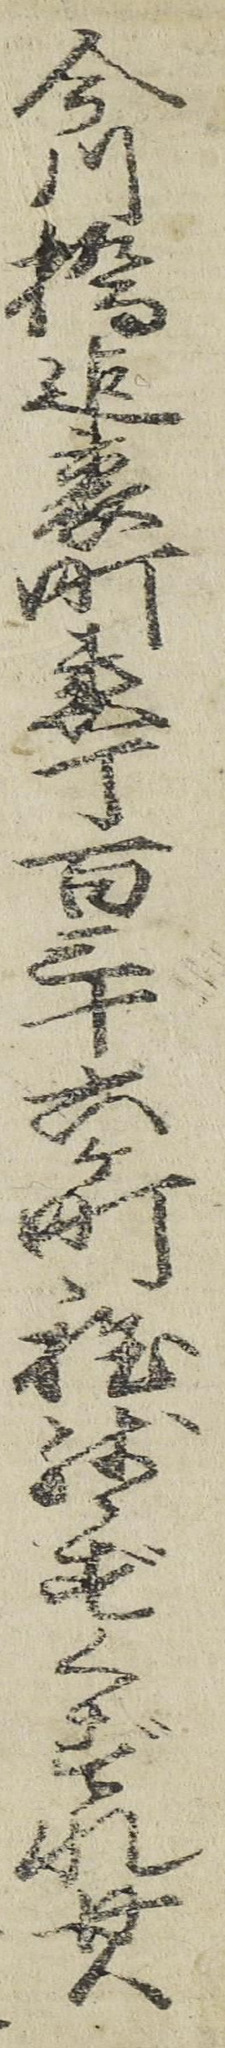今川橋迄裏町表町百三十六ヶ町程残らずくずれ其
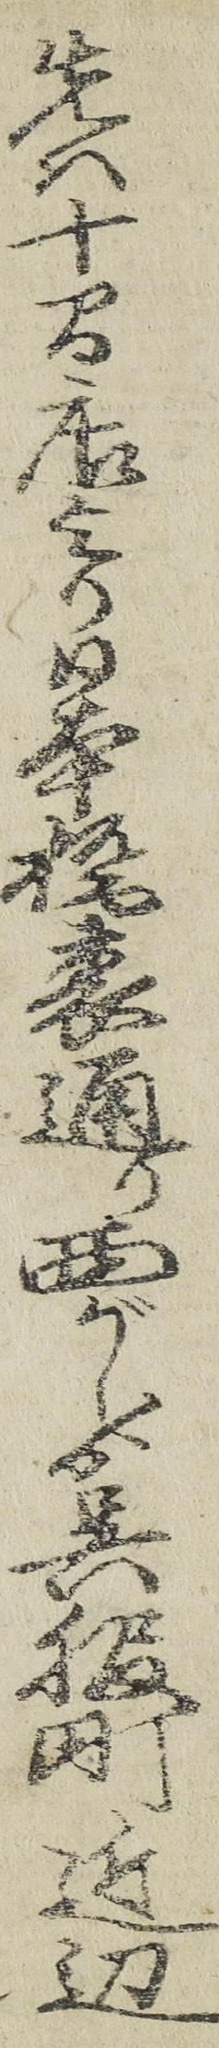先は十間店より日本橋表通り西がしゟ呉服町近辺
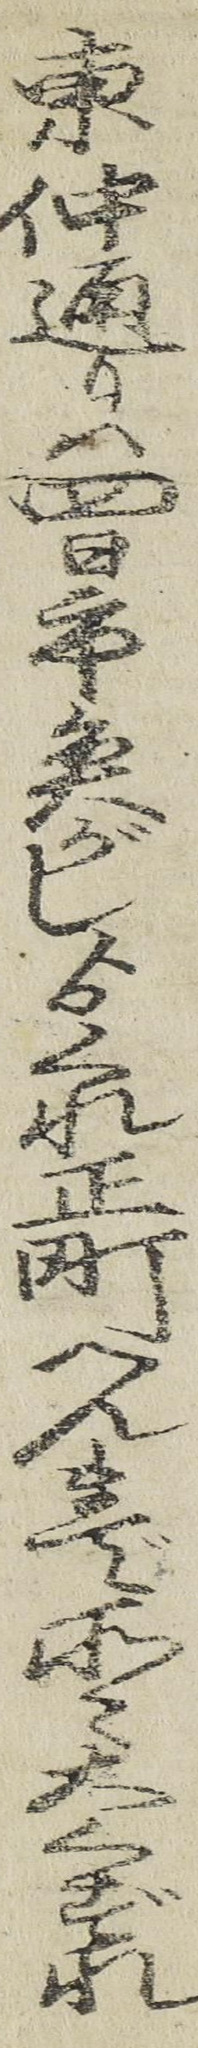東仲通りは四日市魚がしゟくれ正町へんまで所々大くずれ
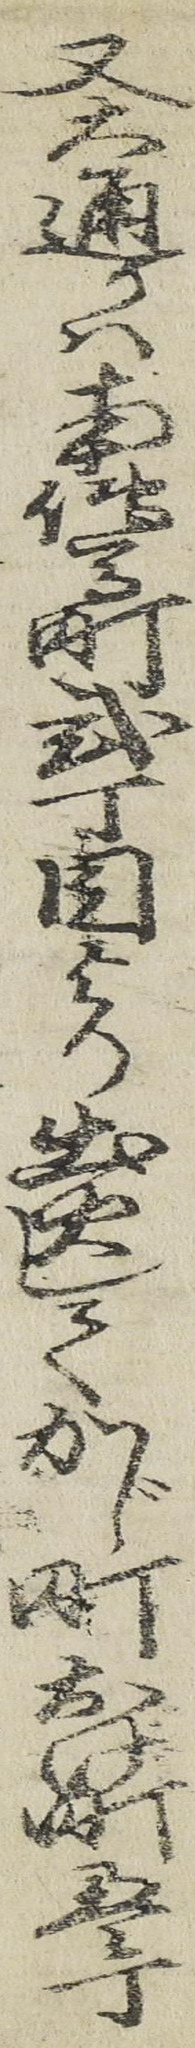又大通りは南傳馬町弐丁目より出火してかじ町おけ町畳丁
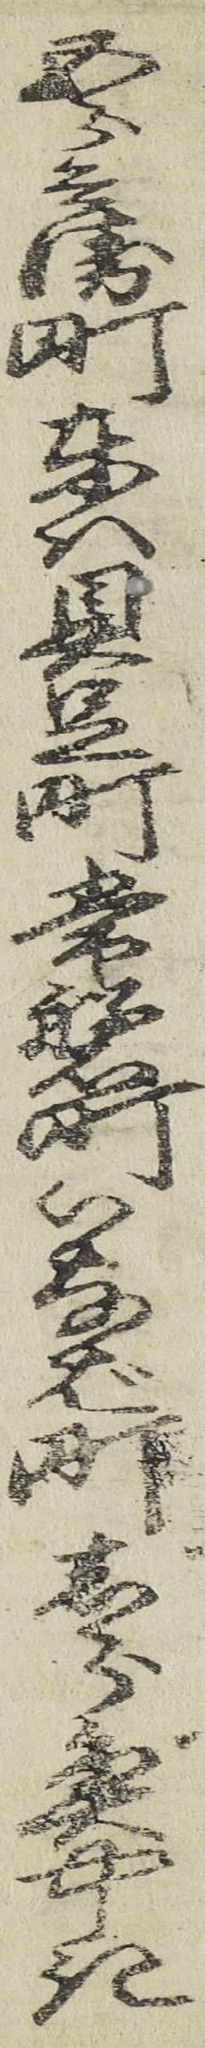五郎兵衛町東は具足町常盤町いなば町しら魚やしき
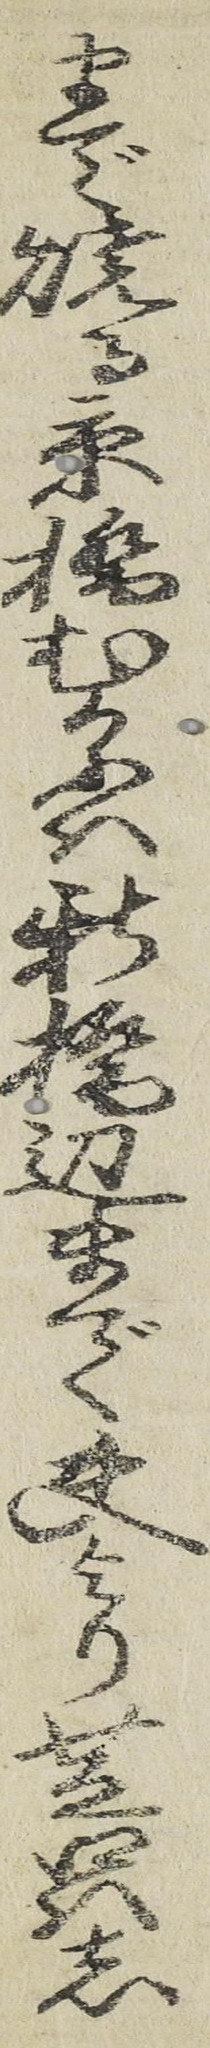まで焼る京橋むかふは新橋辺まで夫より芝口はし
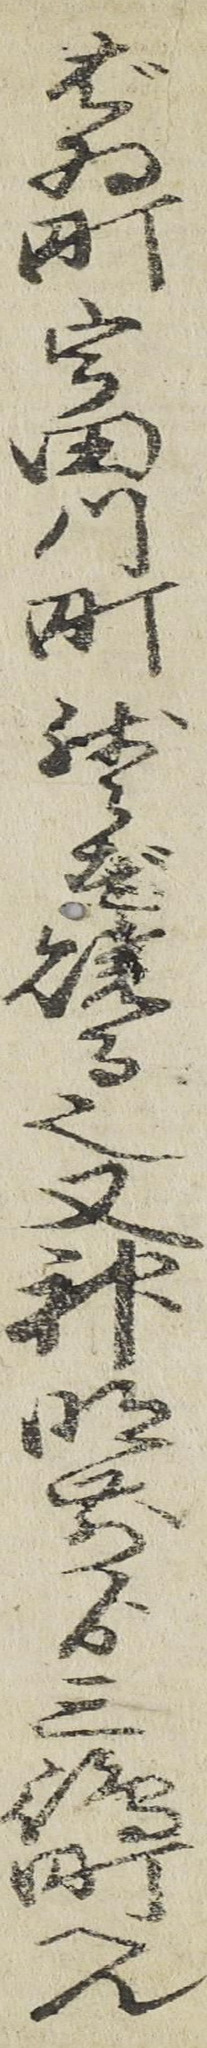ばゐ町宇田川町残らず焼る也又神明前ゟ三嶋町へん
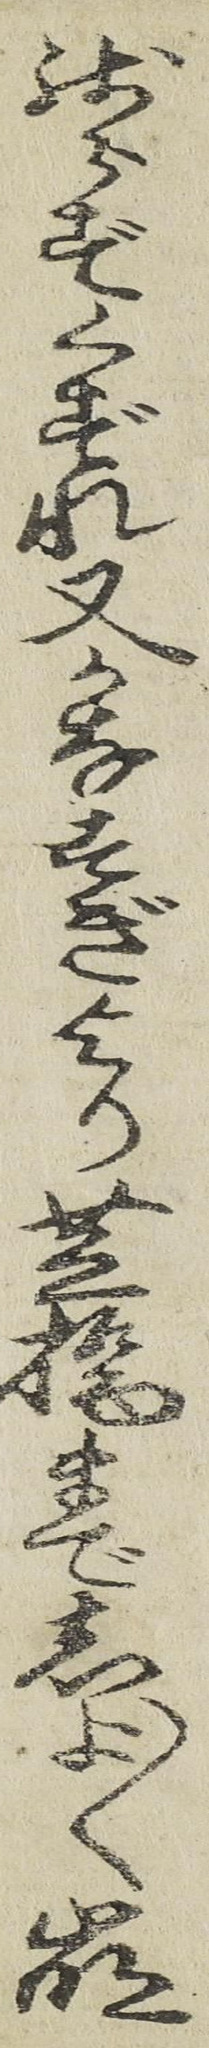残らずくずれ又かなすぎより芝橋までしよ〳〵崩
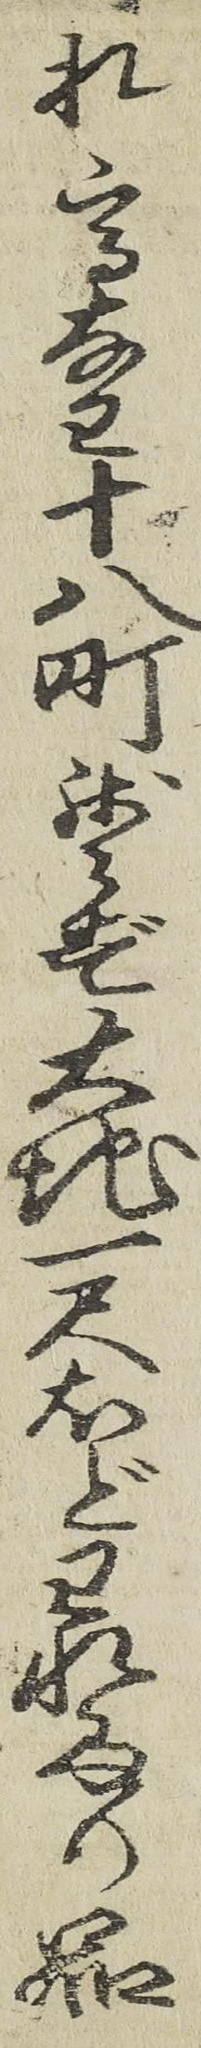れ高なわ十八町残らず大地一尺ほどわれたり品
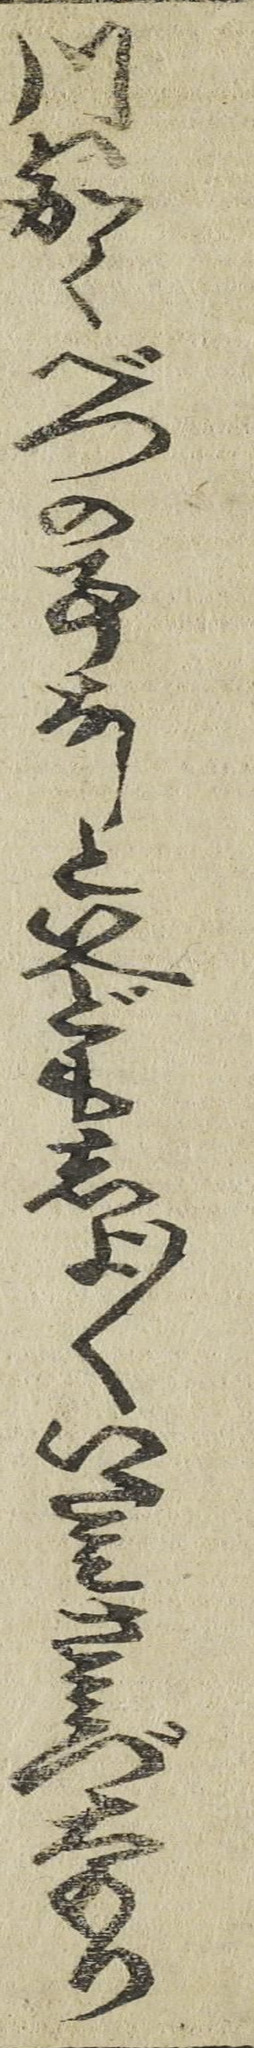川はかくべつの事なしといへどもしよ〳〵いたみきみづ大もり
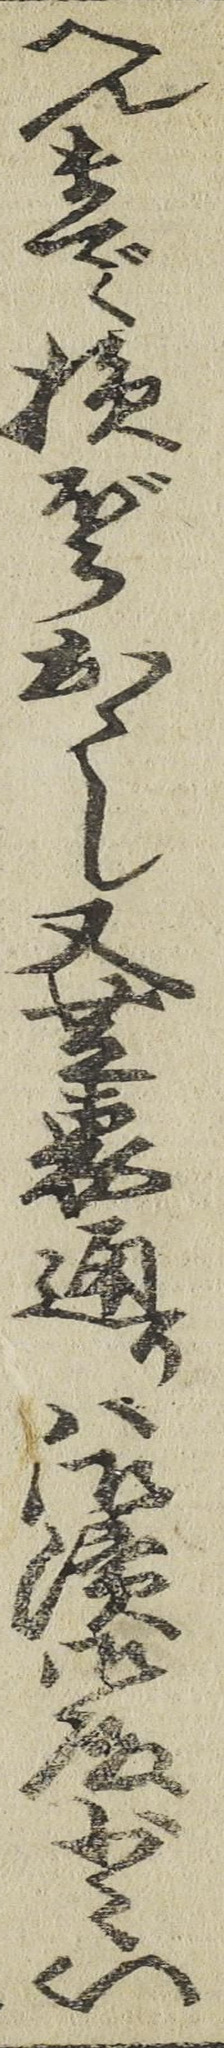へんまで損亡おゝし又芝裏通りは御浜御殿少々い
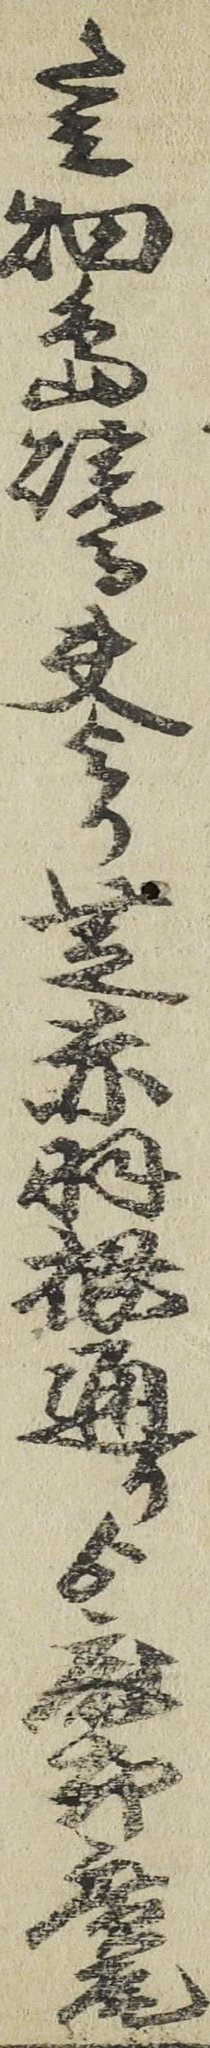たみ畑嶋焼る夫より芝赤羽根通りゟ麻布広尾
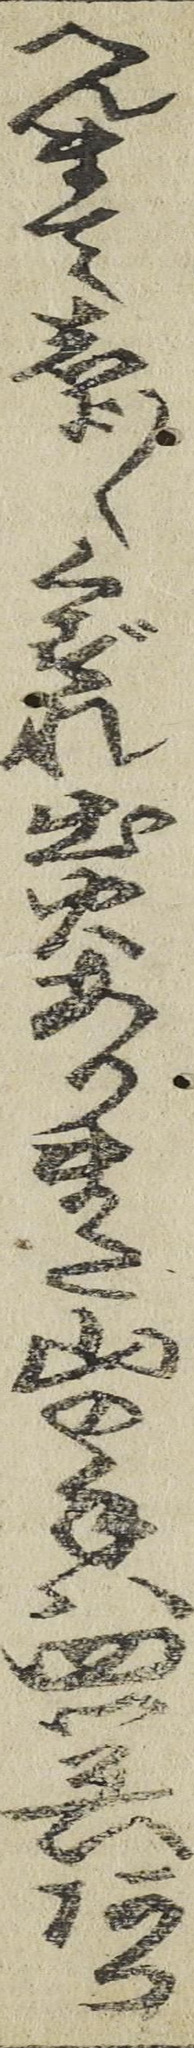へんまでしよ〳〵くずれ出火ありまた山の手は四つ谷あか
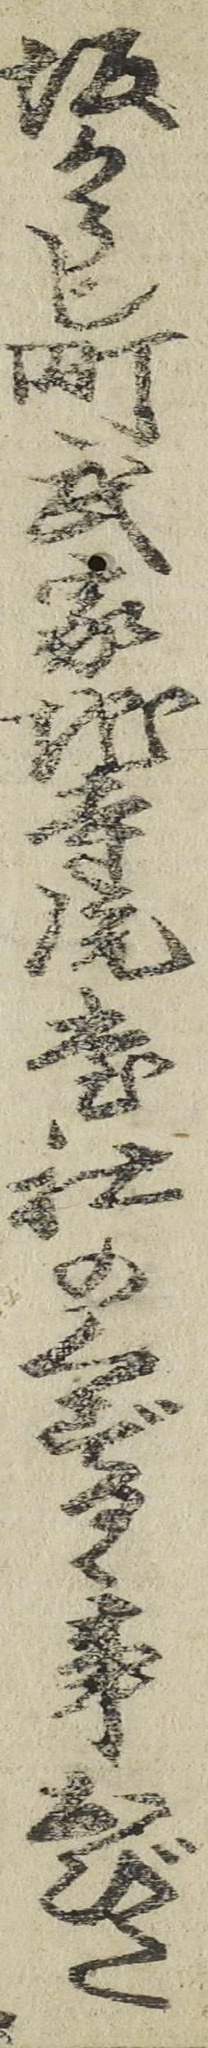坂かうじ町武家地寺院堂社のくずるゝ事おびた
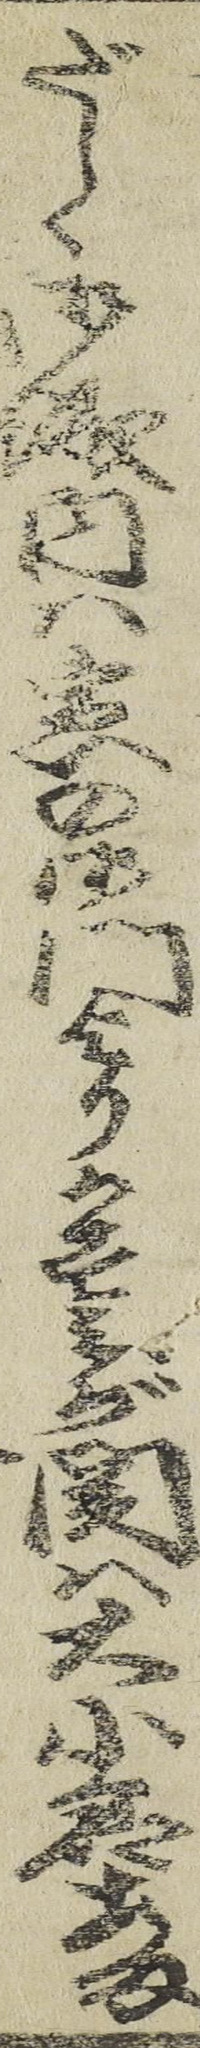だしく御城内は寅の御門よりかすみが関は大小崩あま
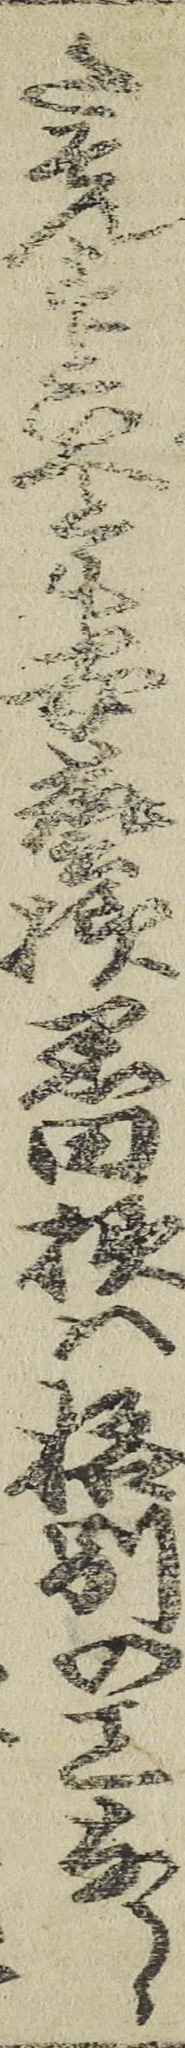たそんじるといへども安芸様黒田様は各別のことなし
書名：安政大地震畧記　全
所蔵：東京大学地震研究所図書室 Earthquake Research Institute Library, The University of Tokyo, JAPAN
